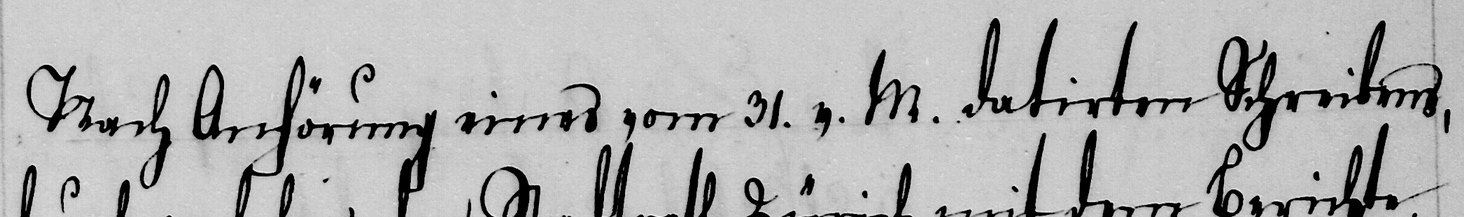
Nach Anhörung eines vom 31. v. M. datirten Schreibens,
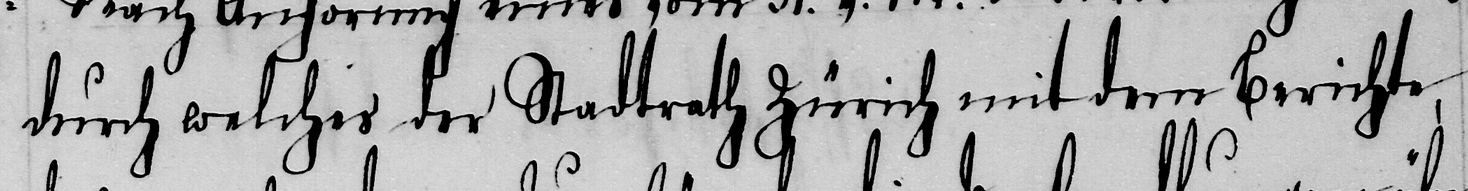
durch welches der Stadtrath Zürich mit dem Berichte,
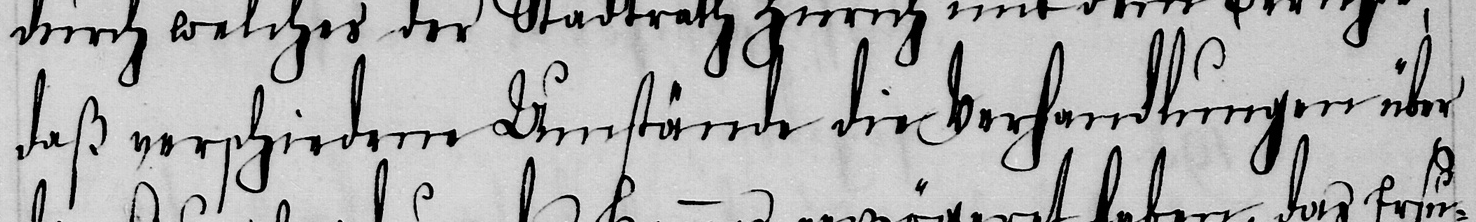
daß verschiedene Umstände die Verhandlungen über
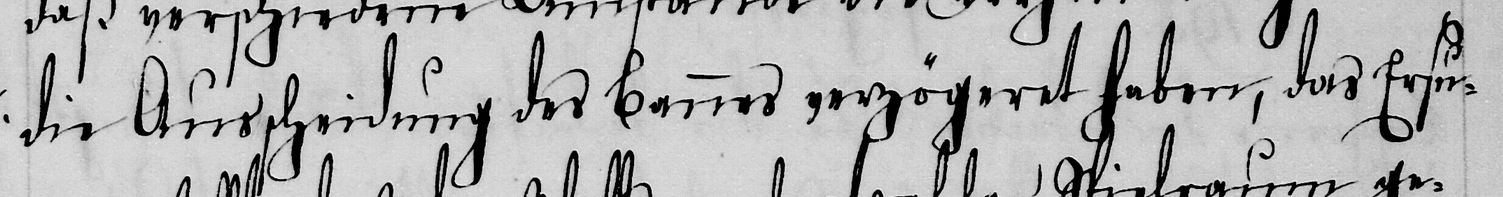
die Ausscheidung des Bannes verzögert haben, das Ersu¬
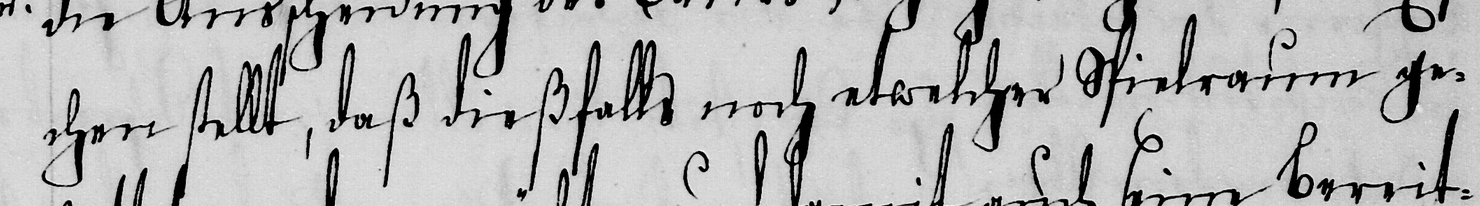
chen stellt, daß diesfalls noch etwelcher Spielraum ges¬
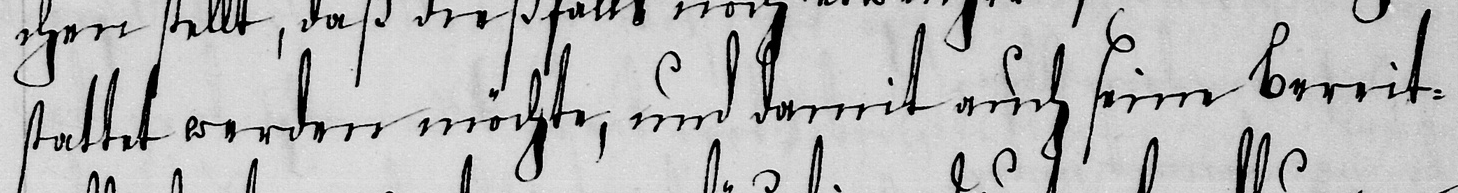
tattet werden möchte, und damit auch seine Bereit¬
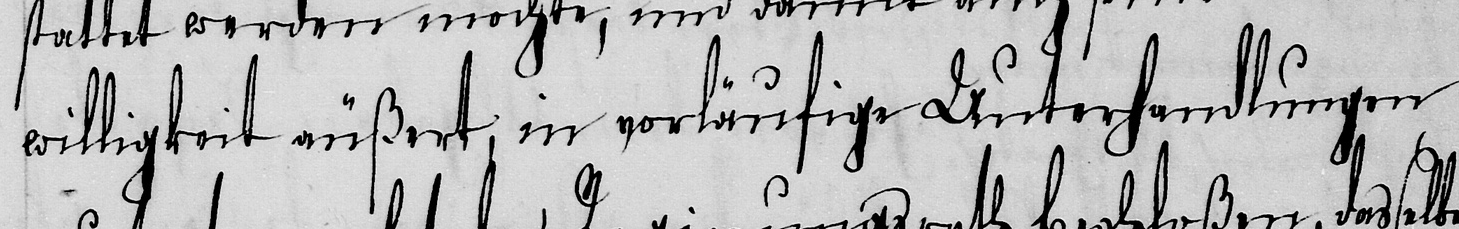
willigkeit äußert, in vorläufige Unterhandlungen
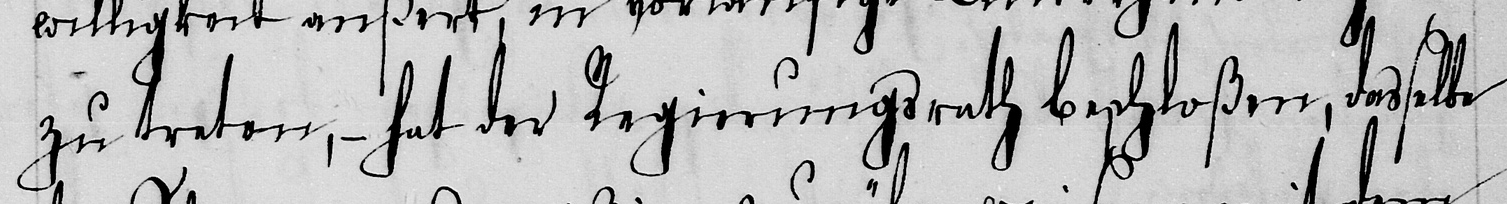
zu treten, – hat der Regierungsrath beschloßen, dasselbe
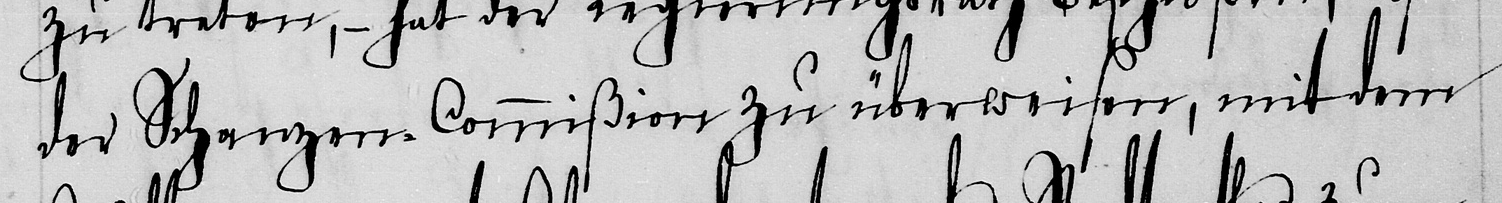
der Schanzen-Commißion zu überweisen, mit dem
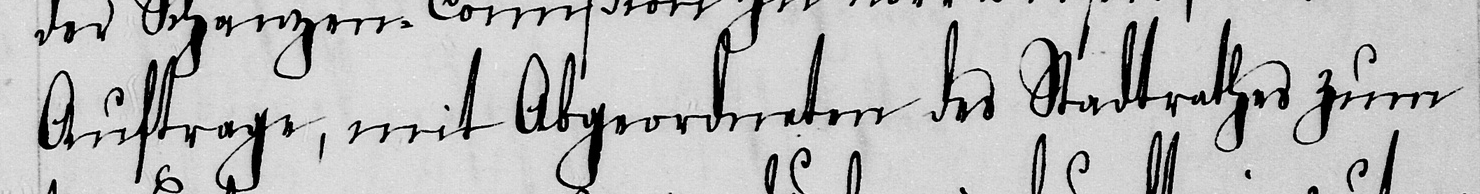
Auftrage, mit Abgeordneten des Stadtrathes zum
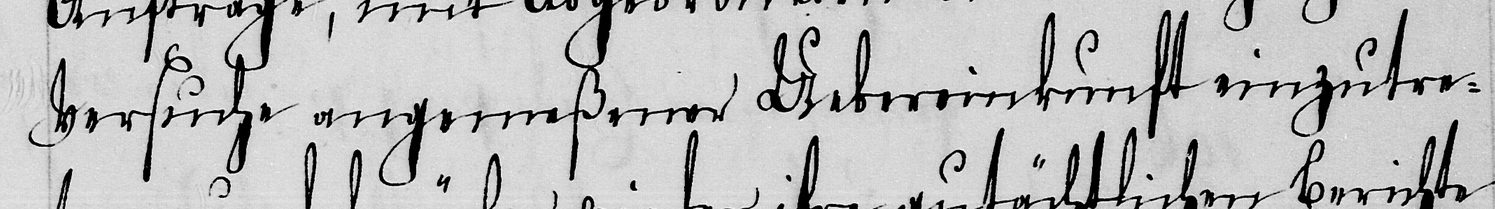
Versuche angemeßener Uebereinkunft einzutre¬
